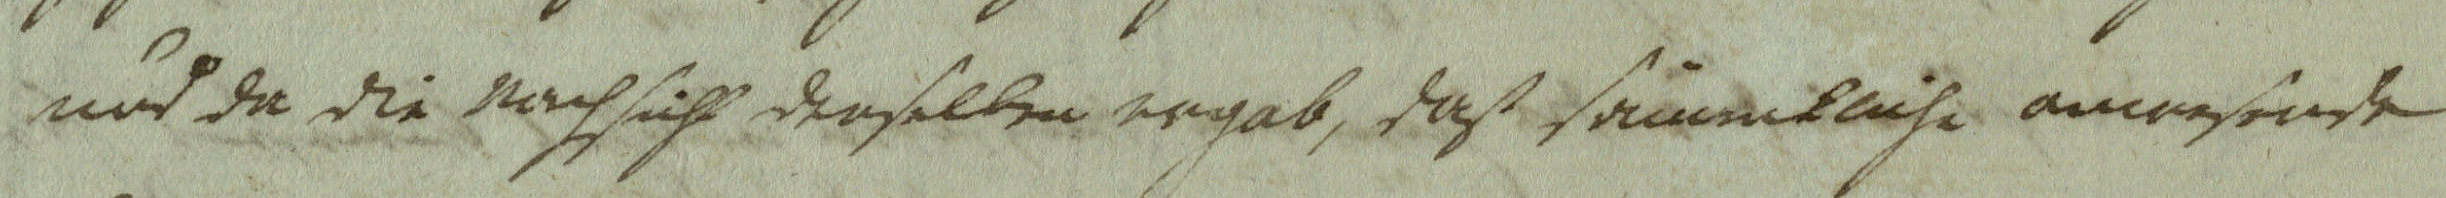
und da die Nachsicht derselben ergab, daß sämmtliche anwesende
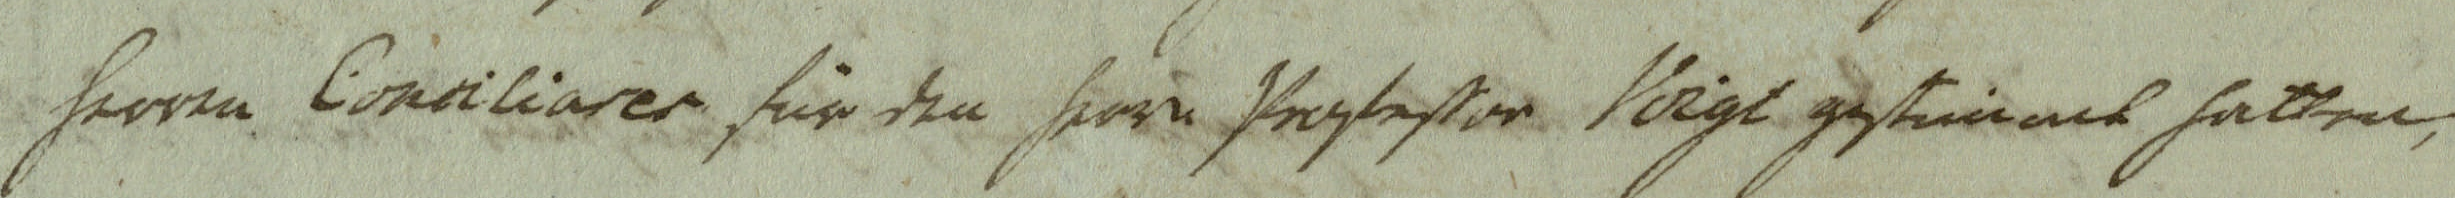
Herrn Conciliares für den Herrn Professor Voigt gestimmt hatten,
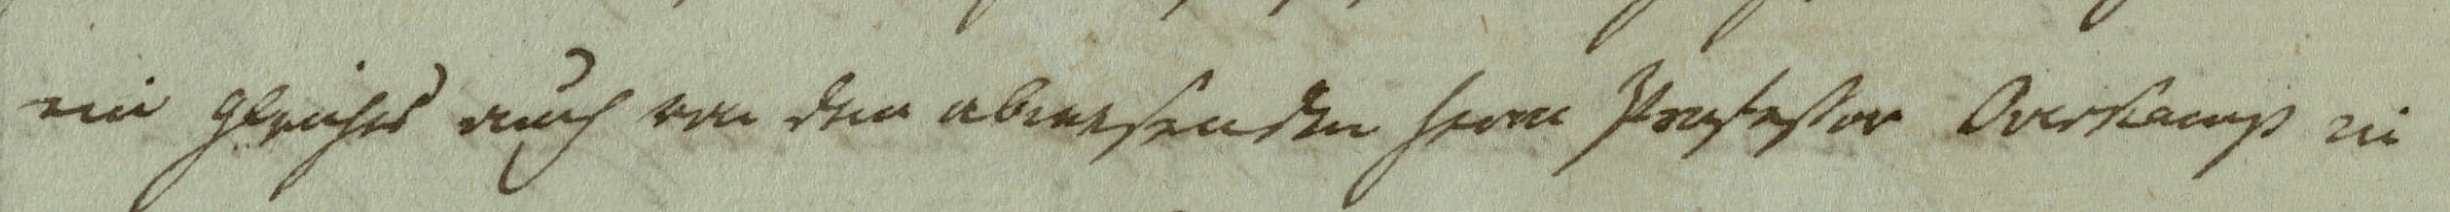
ein gleiches auch von dem abwesenden Herrn Professor Overkamp in
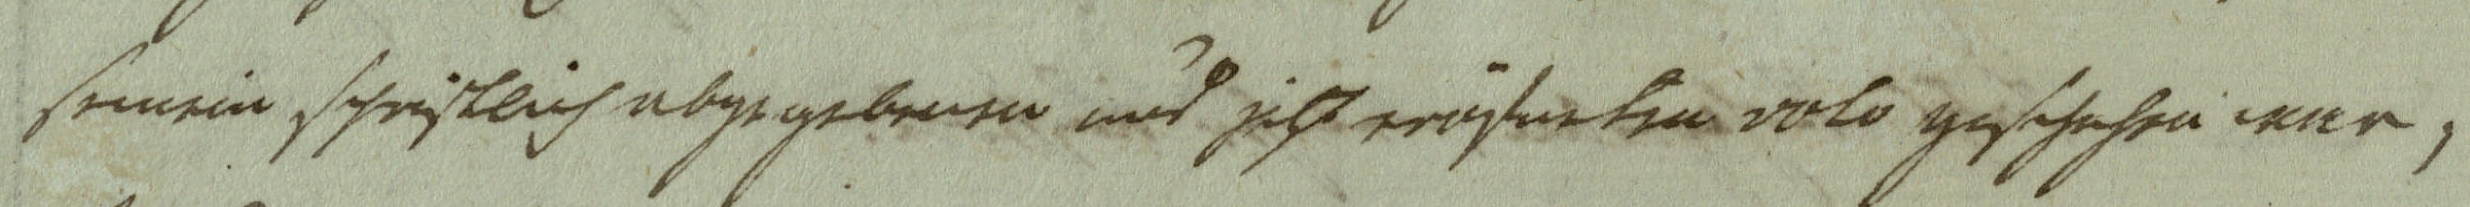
seinem schriftlich abgegebenen und jetzt eröfneten voto geschehen war,
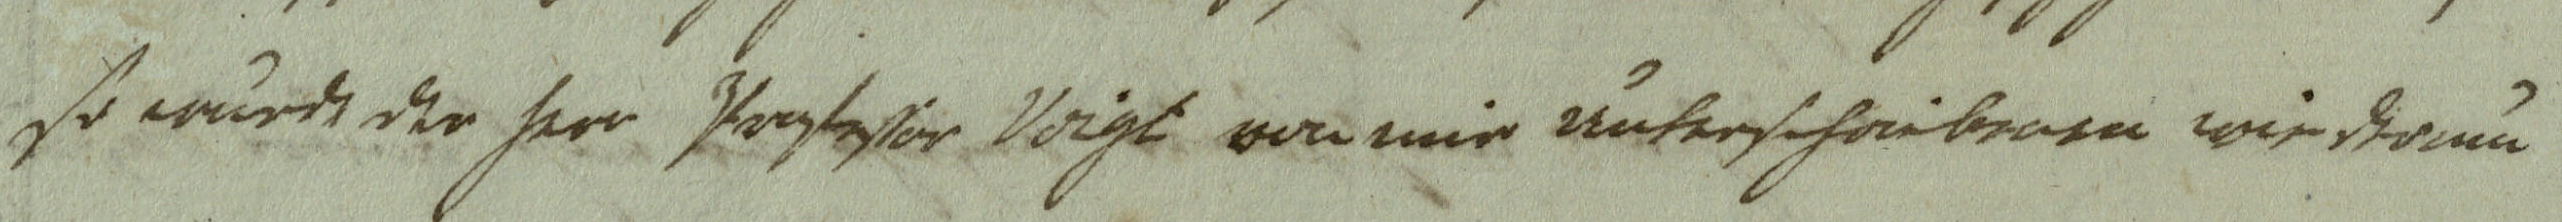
so wurde der Herr Professor Voigt von mir Unterschreibenen wiederum
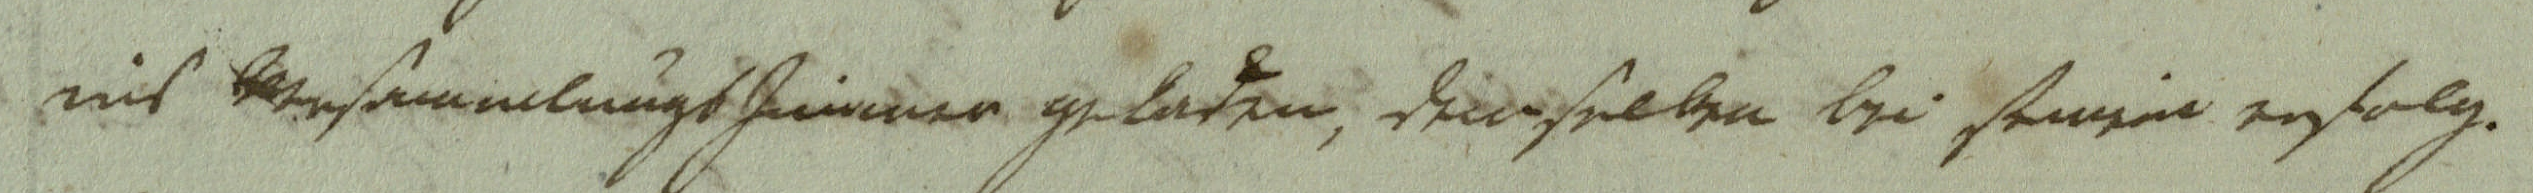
ins Versammlungszimmer geladen, demselben bei seinem erfolg¬
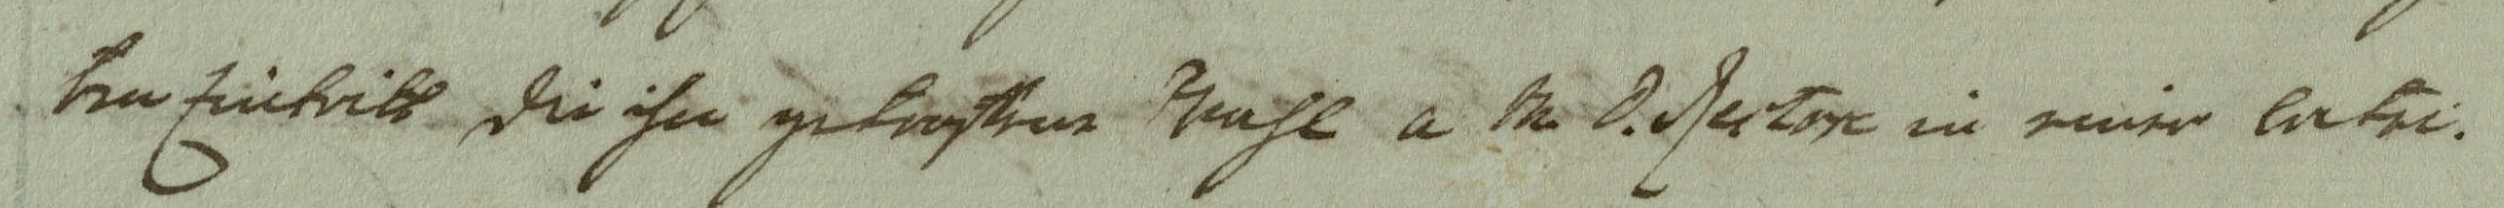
ten Eintritt die ihn getroffene Wahl a. M. D. Rectore in einer latei¬
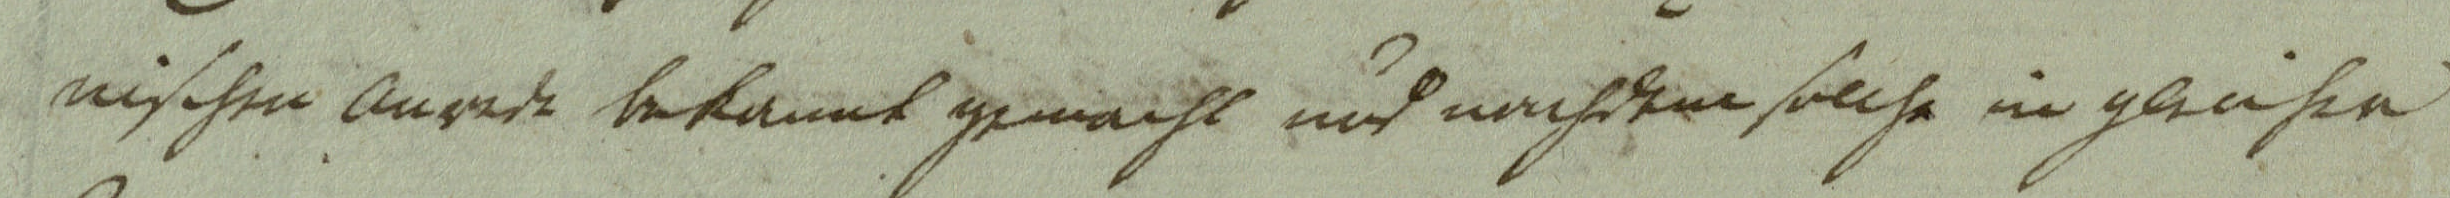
nischen Anrede bekannt gemacht und nachdem solche in gleicher
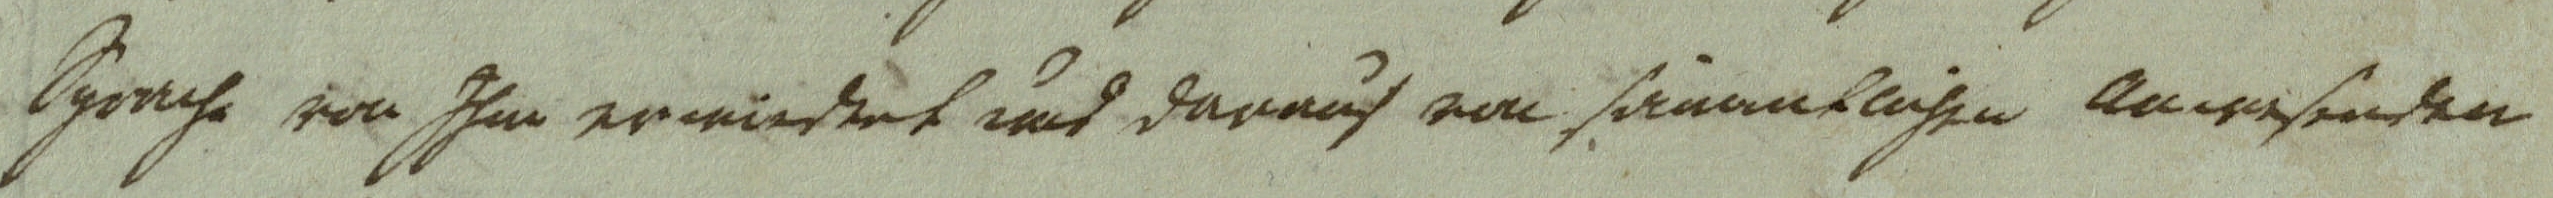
Sprache von Ihm erwiedert und darauf von sämmtlichen Anwesenden
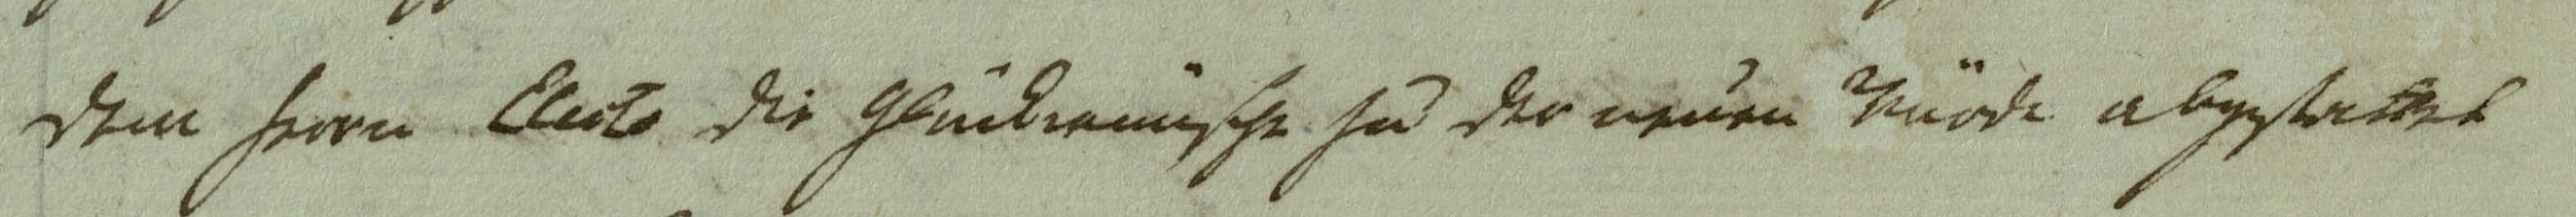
dem Herrn Electo die Glückwünsche zu der neuen Würde abgestattet
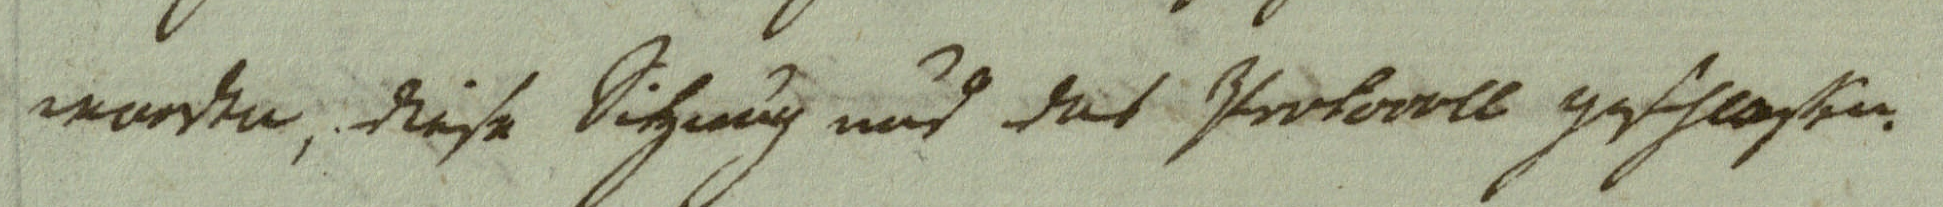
worden, diese Sitzung und das Protocoll geschlossen.
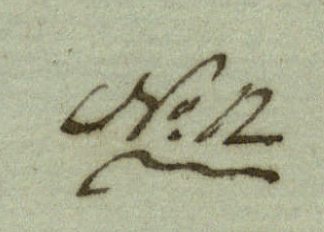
Nº 12.
